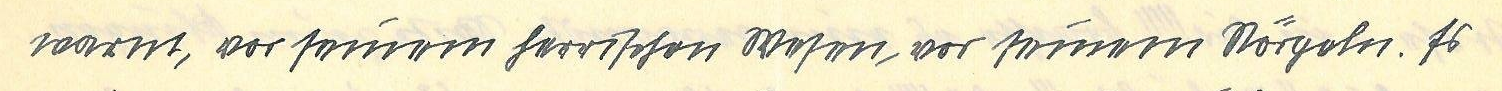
warnt, vor seinem herrischen Wesen, vor seinem Nörgeln. Es
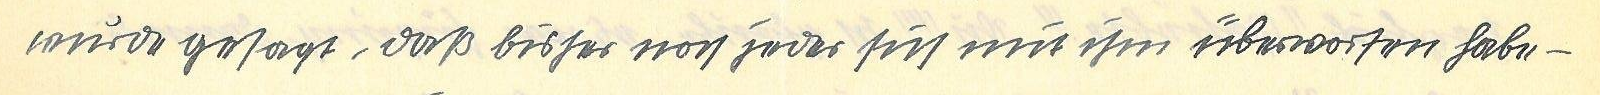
wurde gesagt, daß bisher noch jeder sich mit ihm überworfen habe –
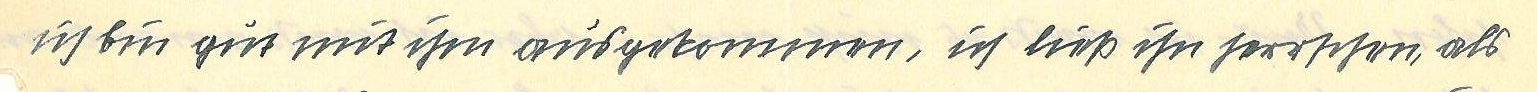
ich bin gut mit ihm ausgekommen, ich ließ ihn herrschen, als
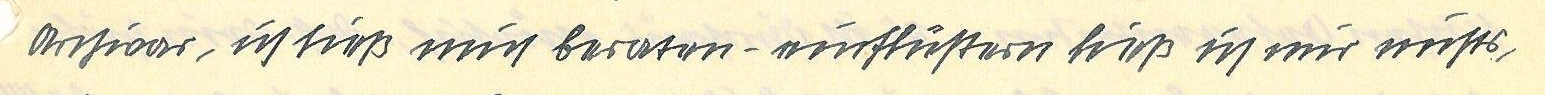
Archivar, ich ließ mich beraten – einflüstern ließ ich mir nichts,
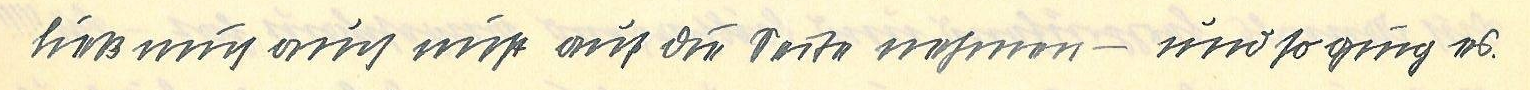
ließ mich auch nicht auf die Seite nehmen – und so ging es.
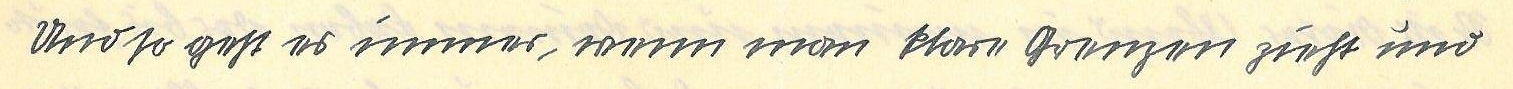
Und so geht es immer, wenn man klare Grenzen zieht und
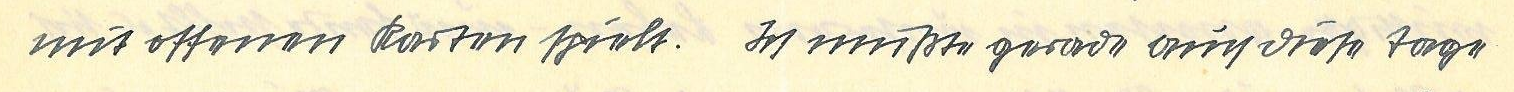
mit offenen Karten spielt. Ich mußte gerade auch diese Tage
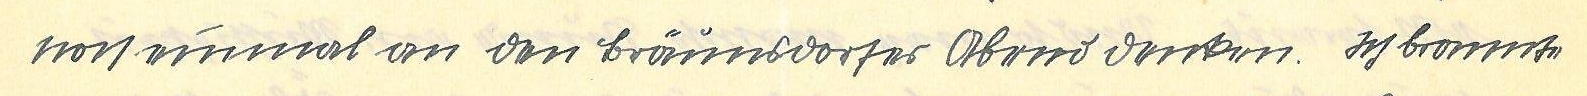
noch einmal an den B.er Abend denken. Ich brannte
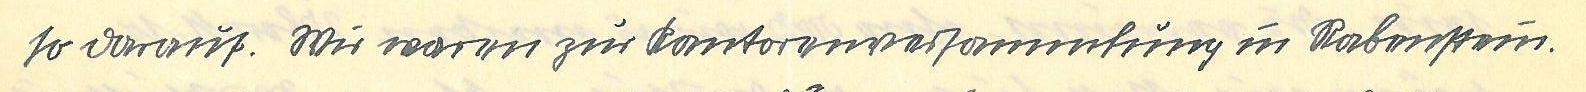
so darauf. Wir waren zur Kantorenversammlung in R.
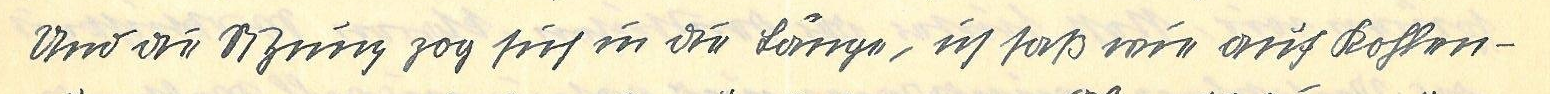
Und die Sitzung zog sich in die Länge, ich saß wie auf Kohlen –
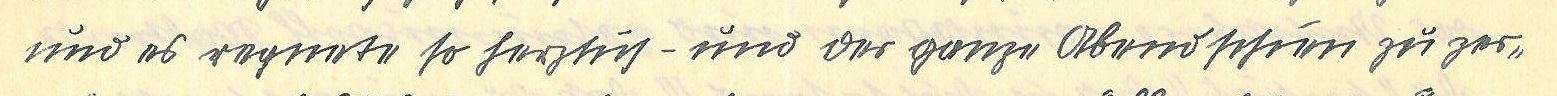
und es regnete so herzlich – und der ganze Abend schien zu zer¬
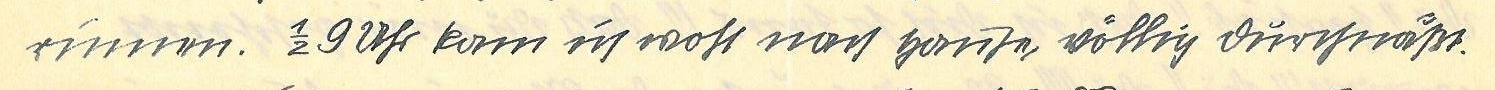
rinnen. ½ 9 Uhr kam ich wohl nach Hause, völlig durchnäßt.
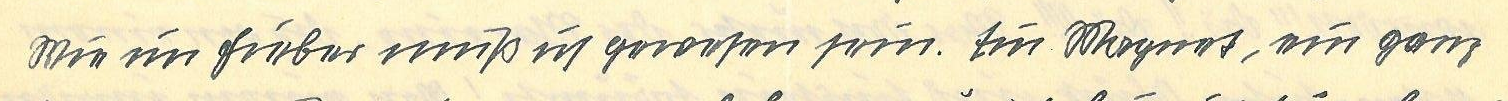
Wie im Fieber muß ich gewesen sein. Ein Magnet, ein ganz
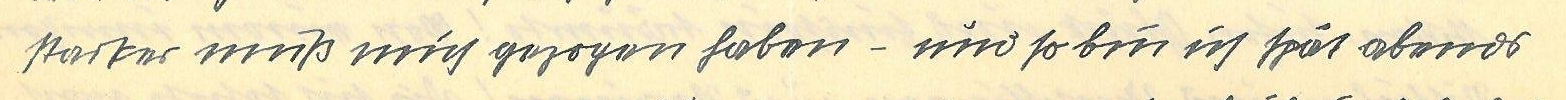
starker muß mich gezogen haben – und so bin spät abends
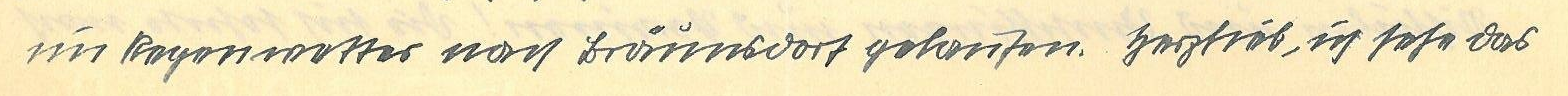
im Regenwetter nach B. gelaufen. Herzlieb, ich sehe das
